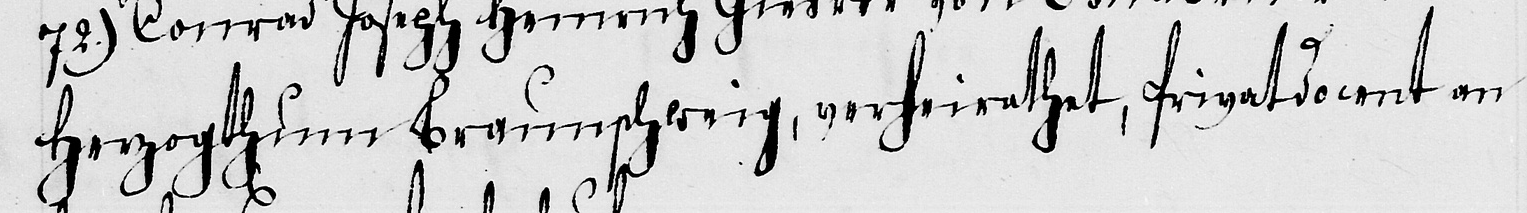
Herzogthum Braunschweig, verheirathet, Privatdocent an
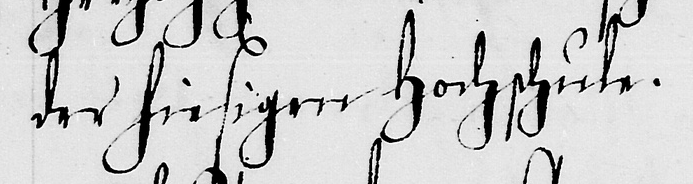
der hiesigen Hochschule.
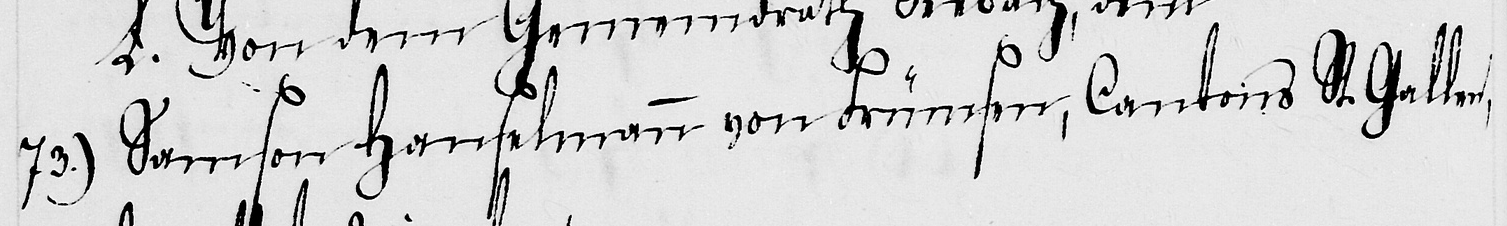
73.) Samson Hanselmann von Frümsen, Cantons St. Galle¬
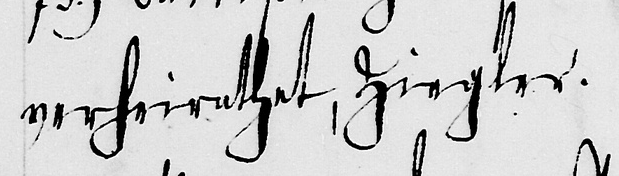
verheirathet, Ziegler.
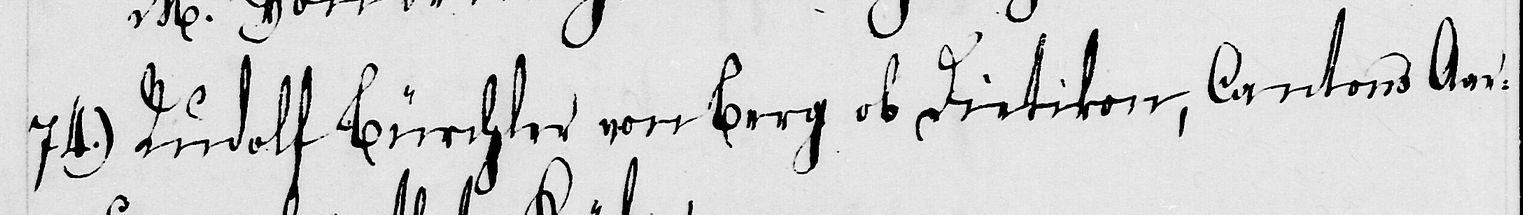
74.) Rudolf Bürchler von Berg ob Dietikon, Cantons Aar¬
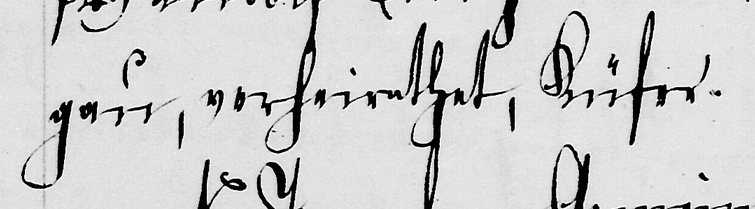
gau, verheirathet, Küfer.
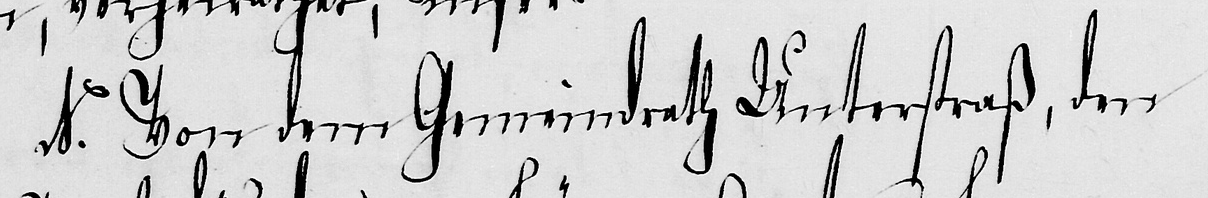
N. Von dem Gemeindrath Unterstraß, den
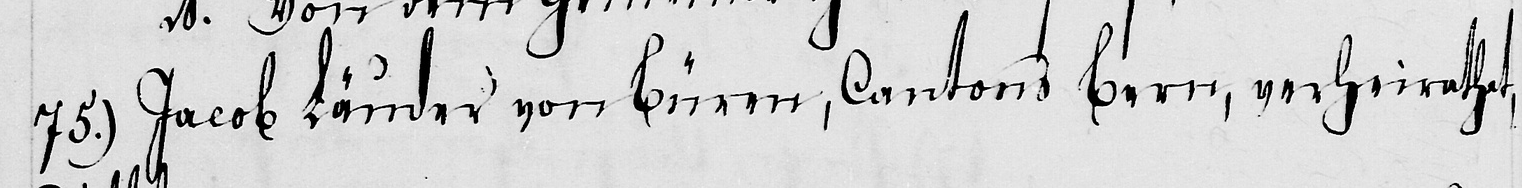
75.) Jacob Läuder von Büren, Cantons Bern, verheirathe¬
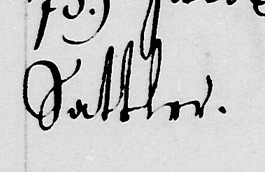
Sattler.
